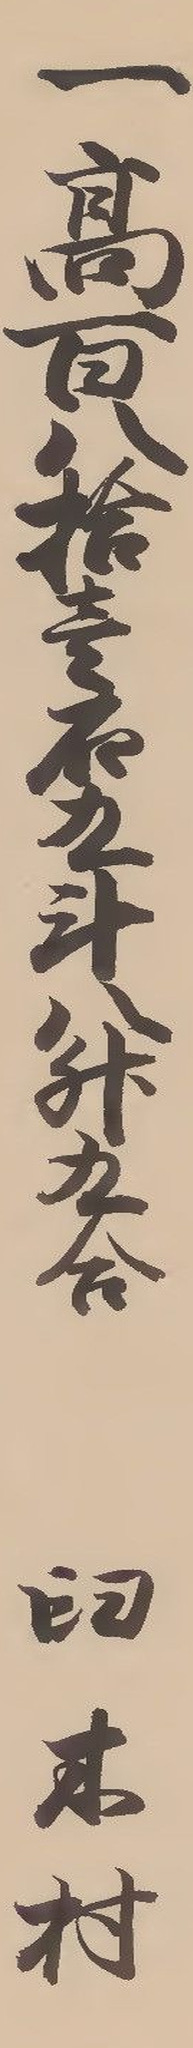一高百八拾壱石九斗八升九合臼木村
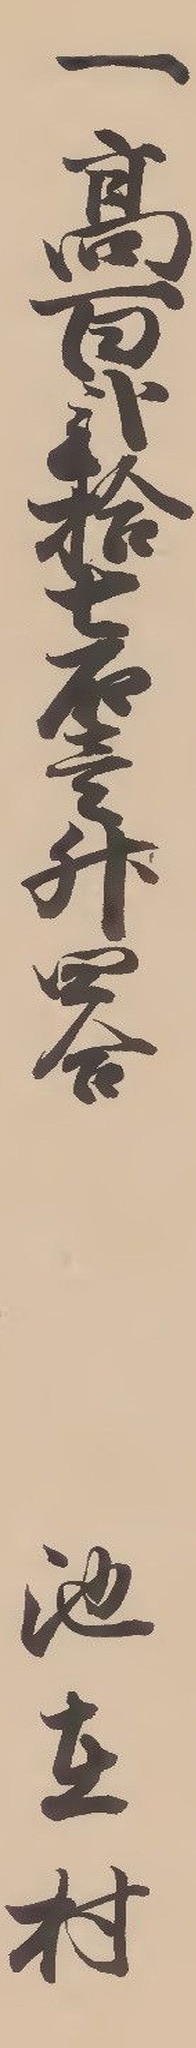一高百弐拾七石壱升四合池在村
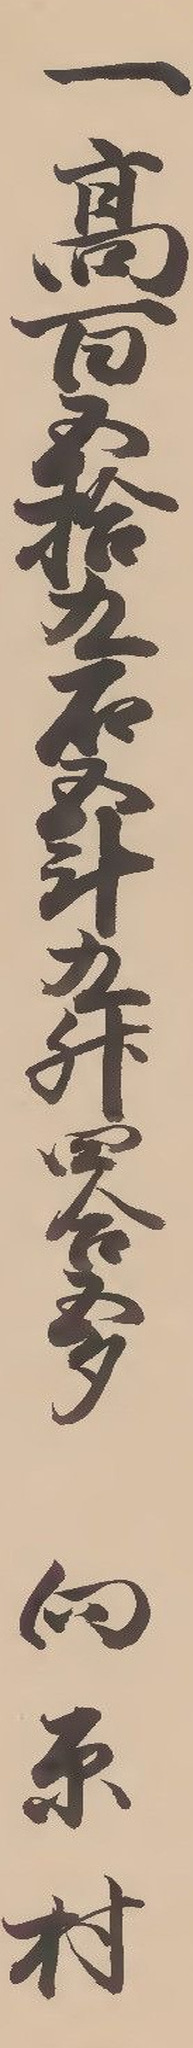一高百五拾九石五斗九升四合五勺向原村
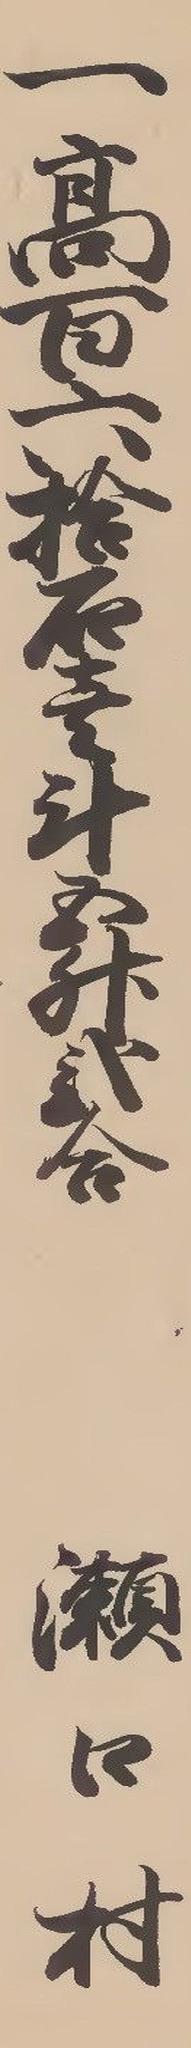一高百六拾石壱斗五升弐合瀬口村
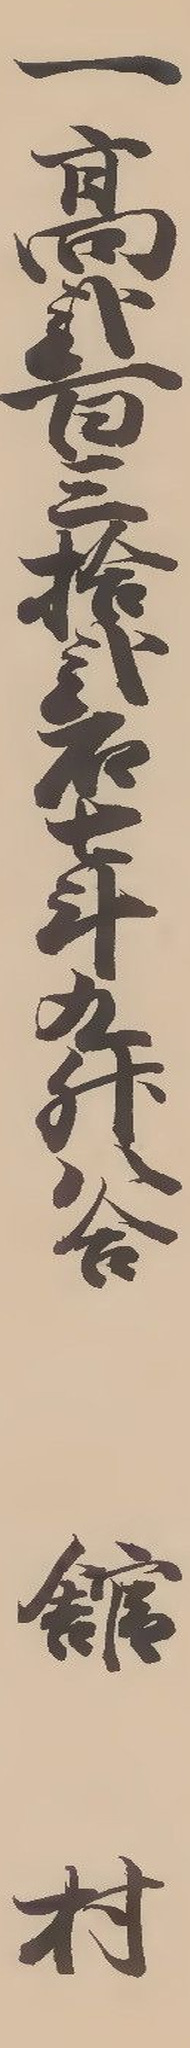一高弐百三拾弐石七斗九升八合館村
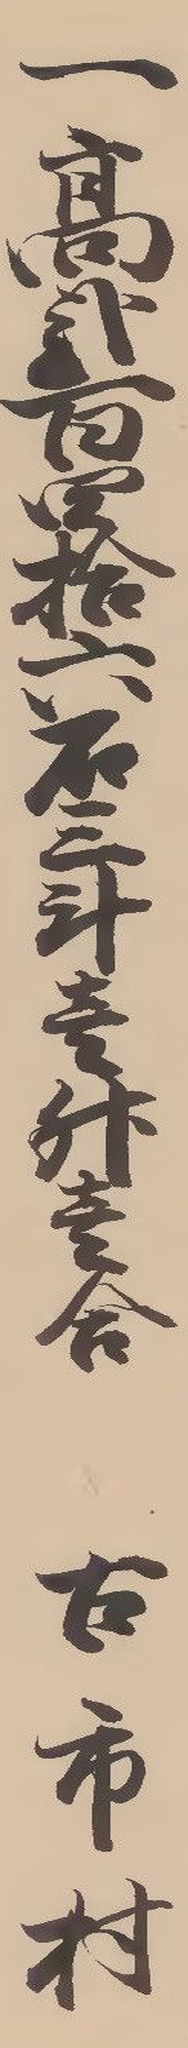一高弐百四拾六石三斗壱升壱合古市村
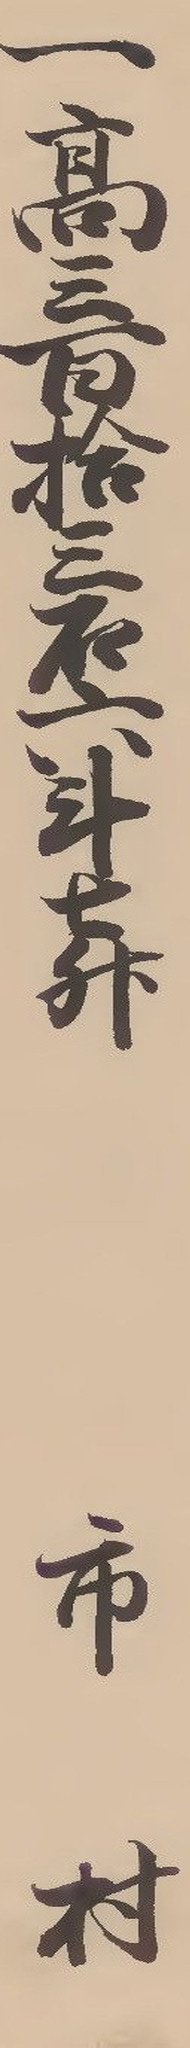一高三百拾三石六斗七升市村

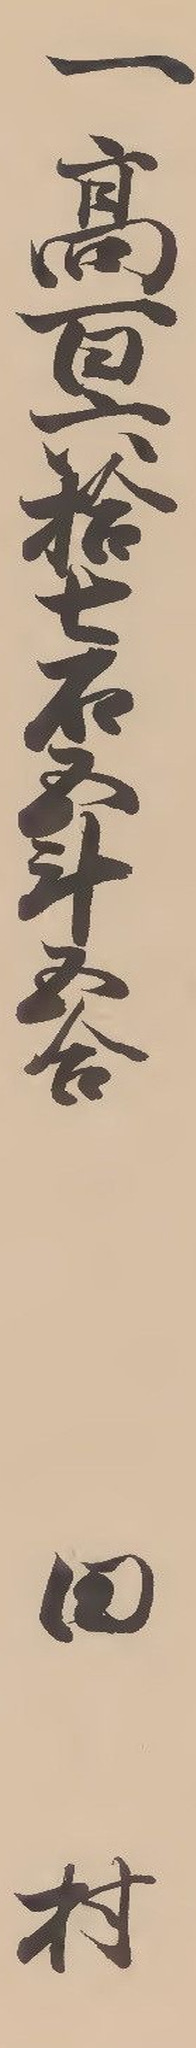一高百六拾七石五斗五合田村
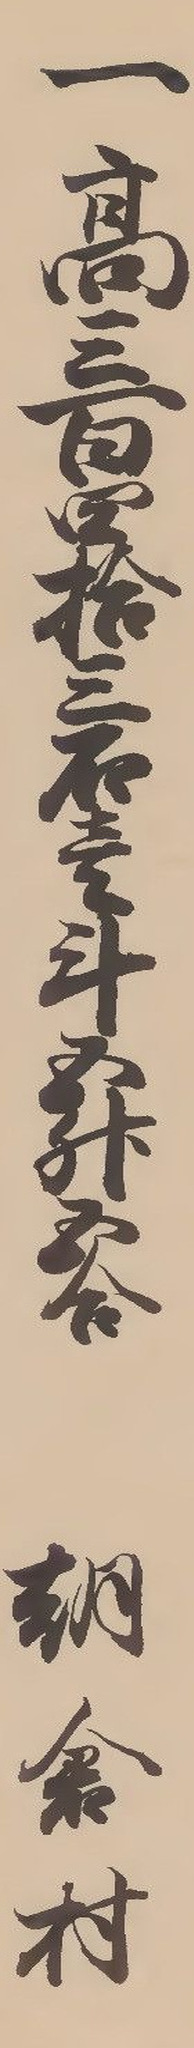一高三百四拾三石壱斗五升五合朝倉村
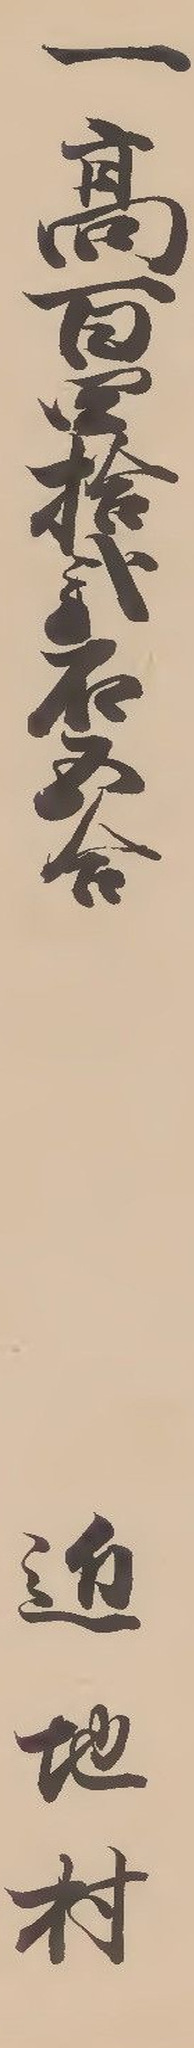一高百四拾弐石五合近地村
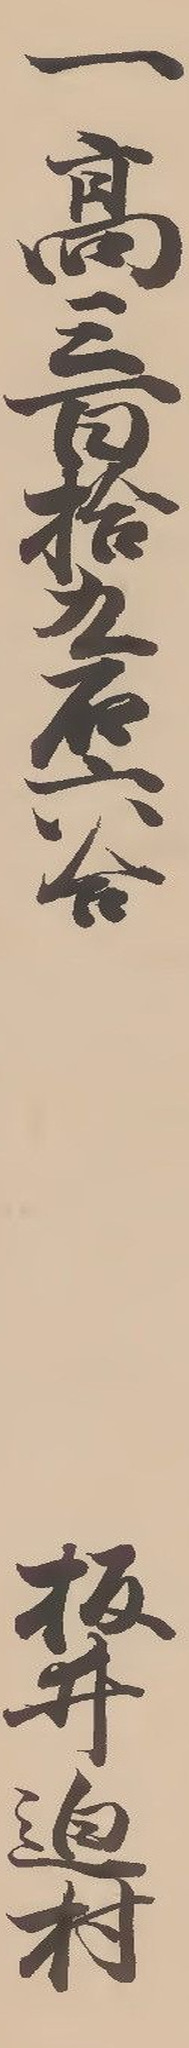一高三百拾九石六合板井迫村
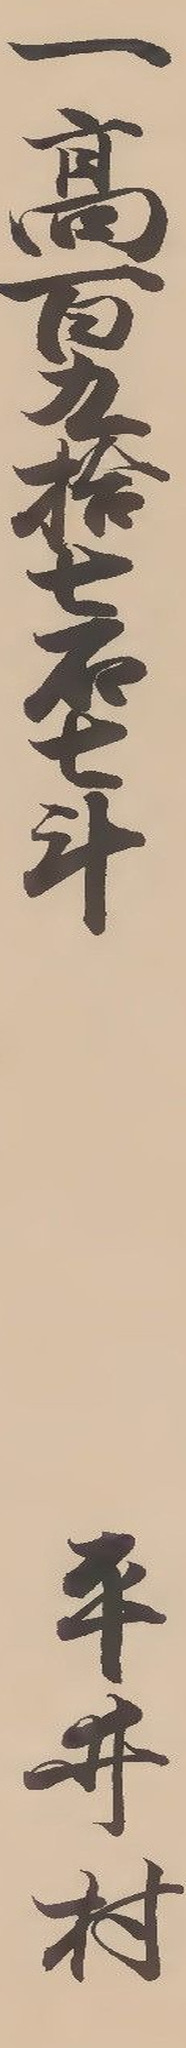一高百九拾七石七斗平井村
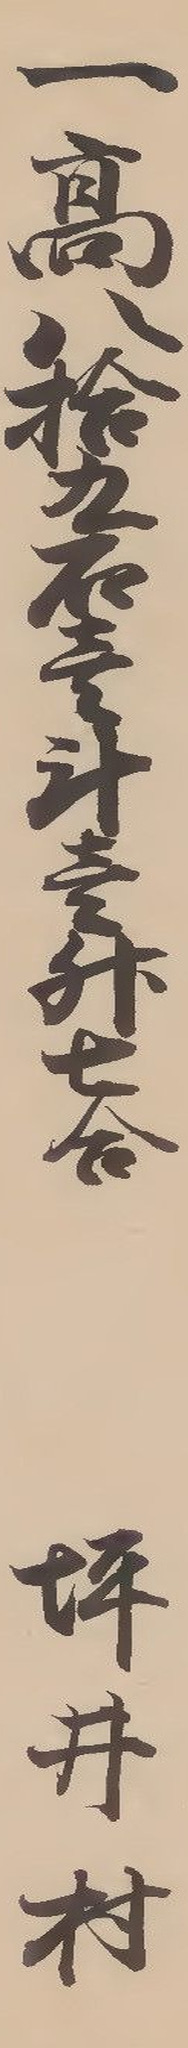一高八拾九石壱斗壱升七合坪井村
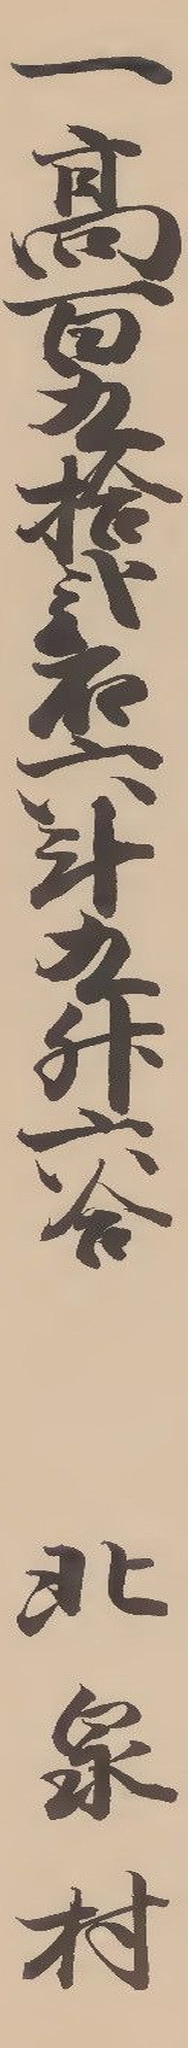一高百九拾弐石六斗九升六合北泉村
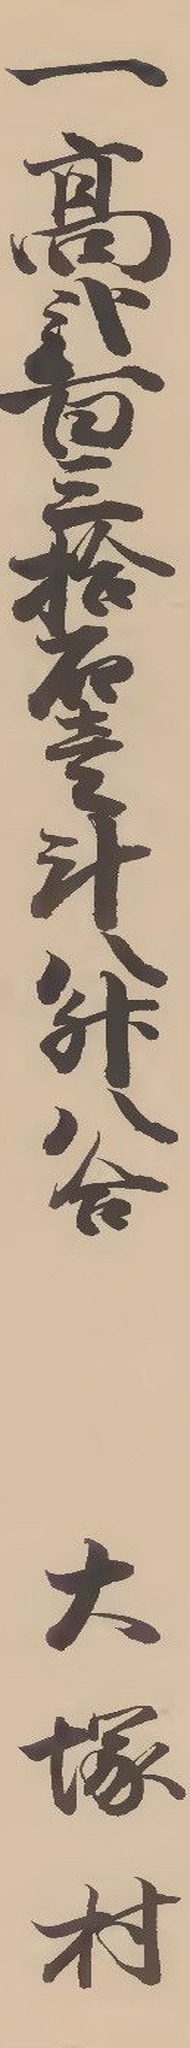一高弐百三拾石壱斗八升八合大塚村

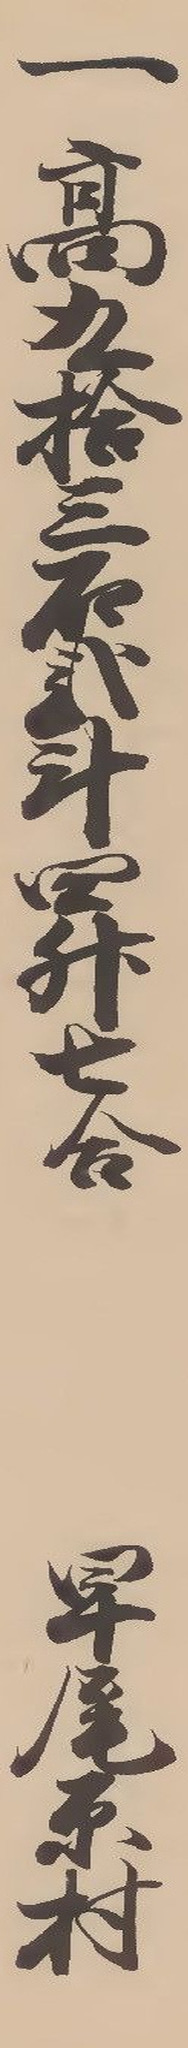一高九拾三石弐斗四升七合早尾原村
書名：豊後国郷帳
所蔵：国立公文書館 National Archives of Japan
